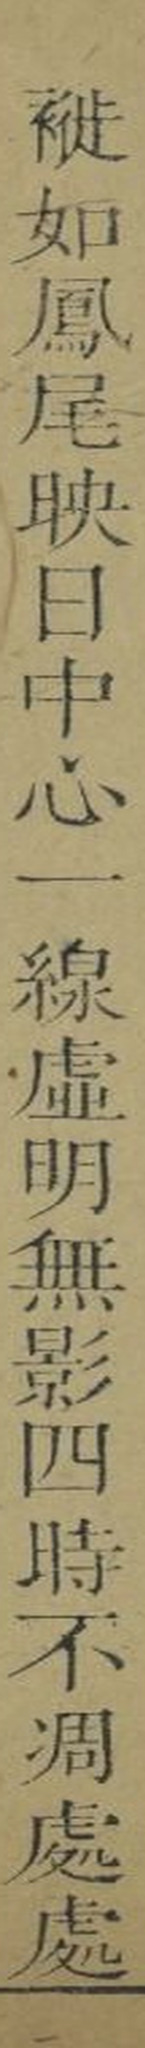褷如鳳尾映日中心一線虚明無影四時不凋処処
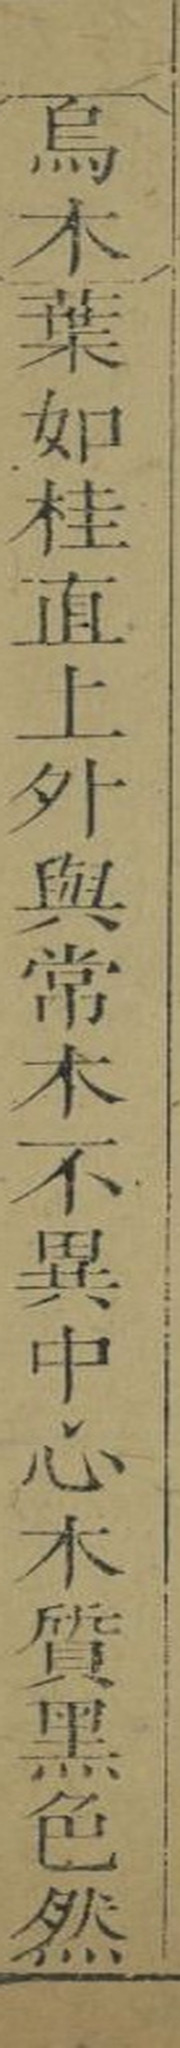[烏木]葉如桂直上外与常木不異中心木質黒色然
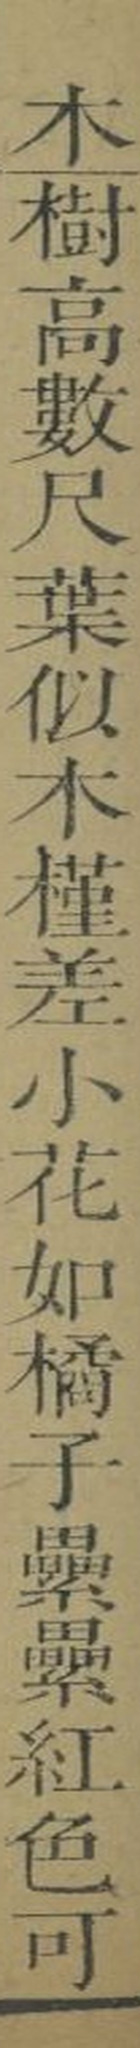木]樹高数尺葉似木槿差小花如橘子纍纍紅色可
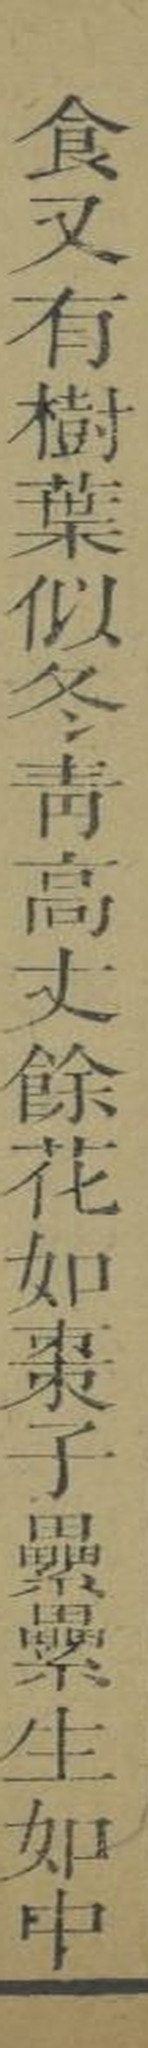食又有樹葉似冬青高丈余花如棗子纍纍生如中
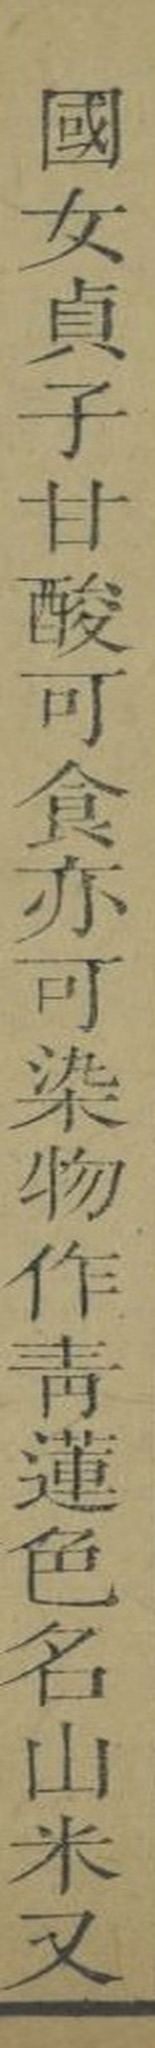国女貞子甘酸可食亦可染物作青蓮色名山米又
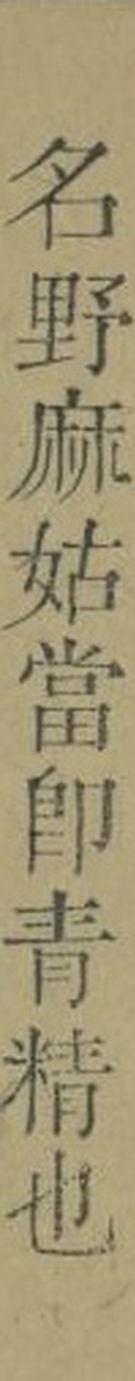名野麻姑当即青精也
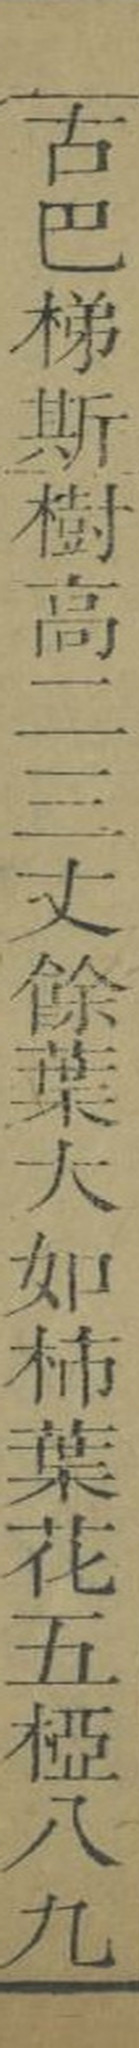[古巴梯斯]樹高二三丈余葉大如柿葉花五椏八九
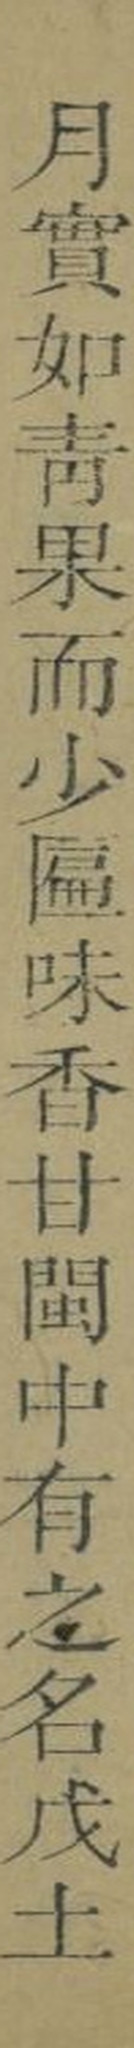月実如青果而少匾味香甘閩中有之名戊土
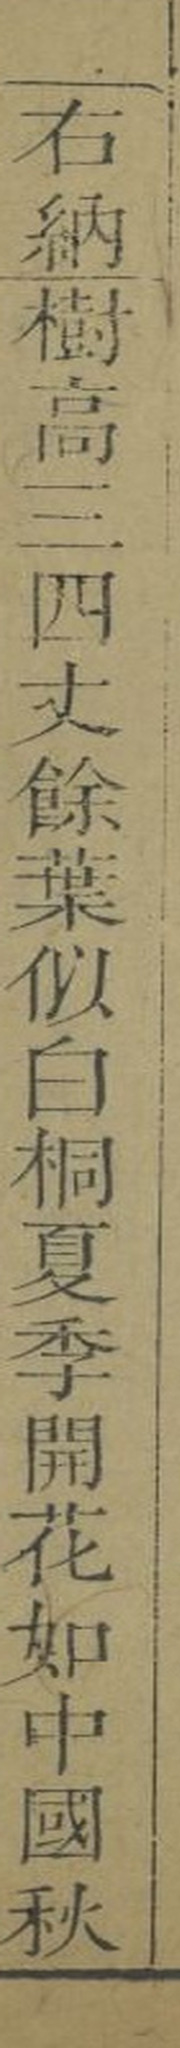[右納]樹高三四丈余葉似白桐夏季開花如中国秋
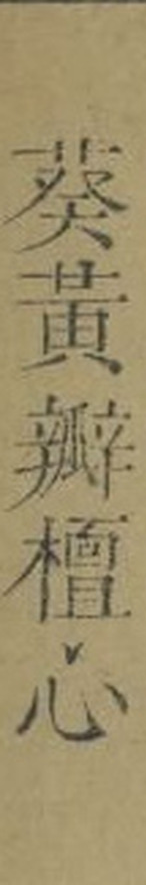葵黄弁檀心

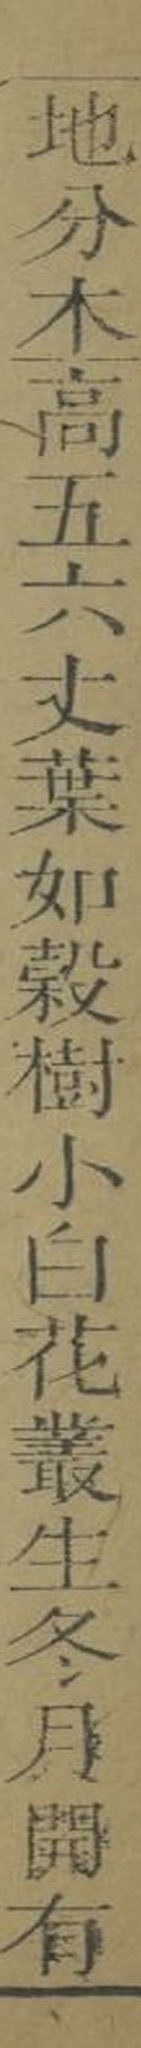[地分木]高五六丈葉如穀樹小白花叢生冬月開有
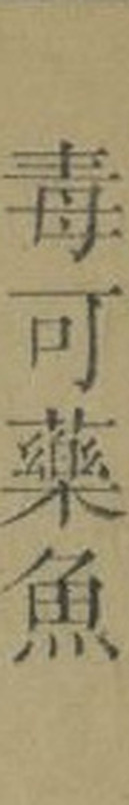毒可薬魚
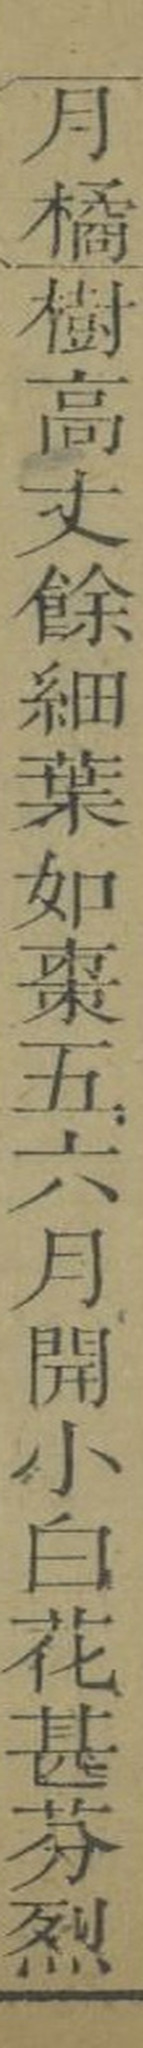[月橘]樹高丈余細葉如棗五六月開小白花甚芬烈
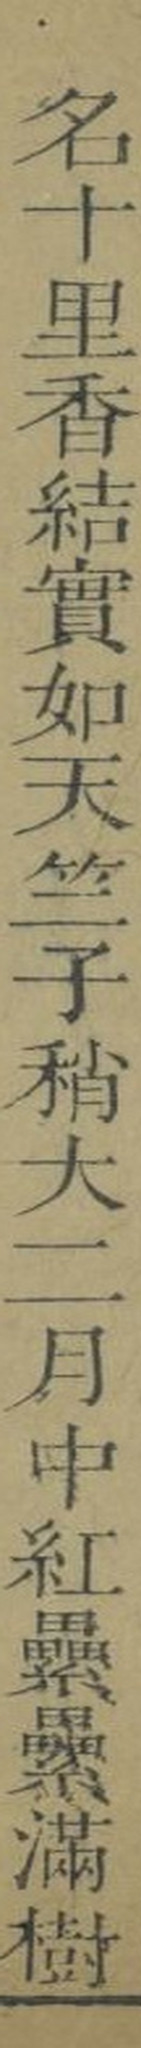名十里香結実如天竺子稍大二月中紅纍纍満樹
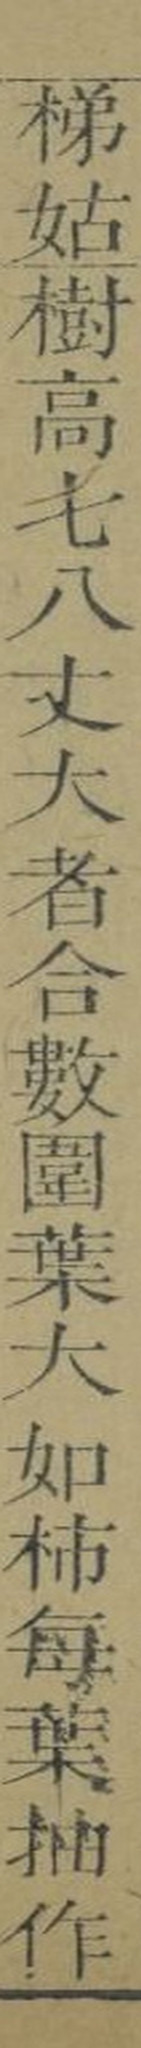[梯姑]樹高七八丈大者合数囲葉大如柿毎葉抽作
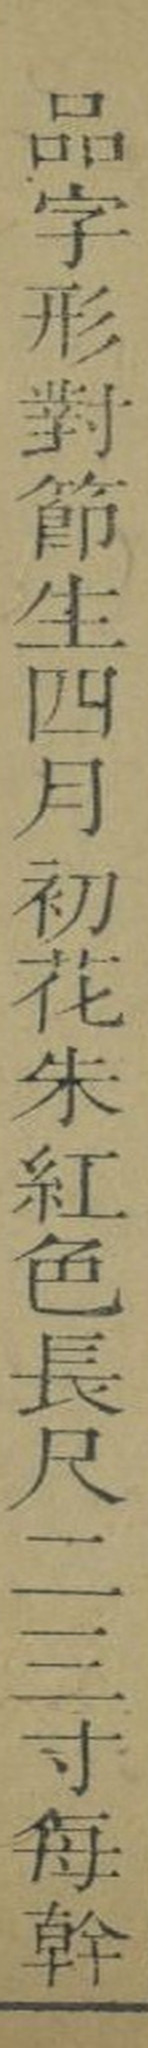品字形対節生四月初花朱紅色長尺二三寸毎幹
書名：中山伝信録 巻六
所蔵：University of the Ryukyus Library
